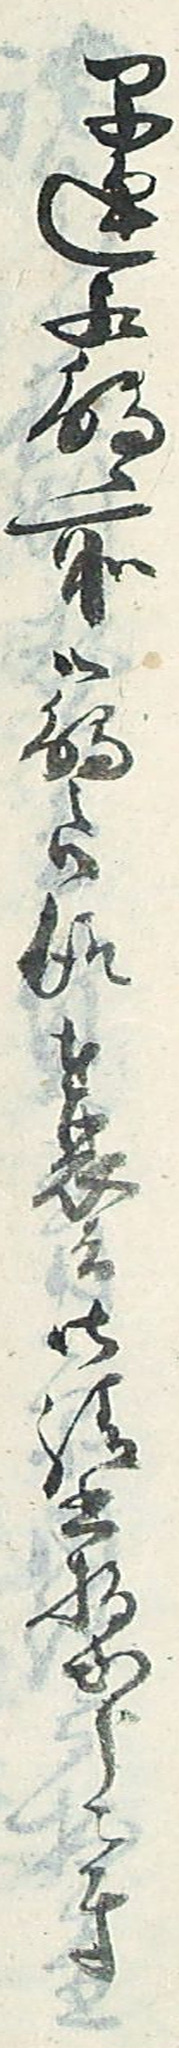早速相触候所御触之御趣奉畏旨御請書指出候に付
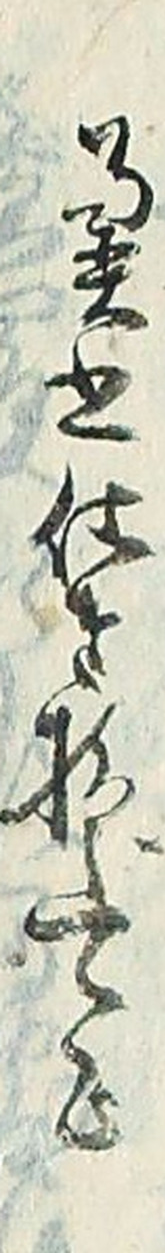奥書仕奉指上候以上
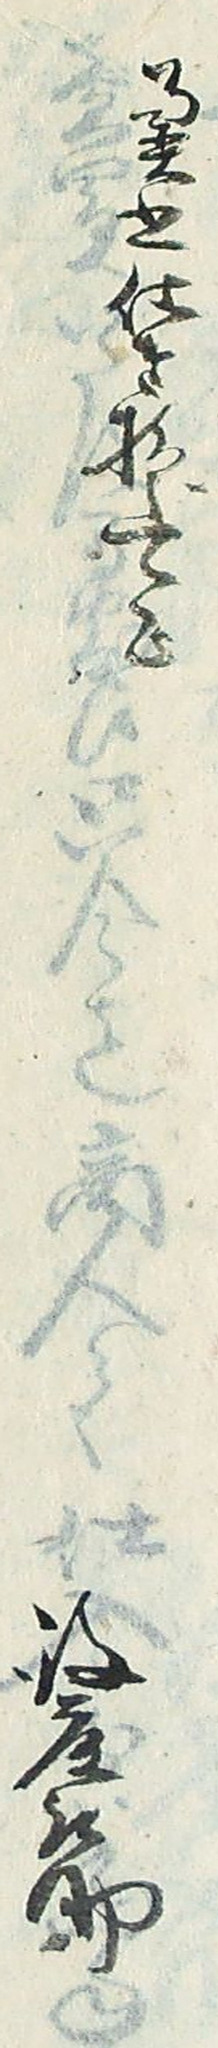奥書仕奉指上候以上
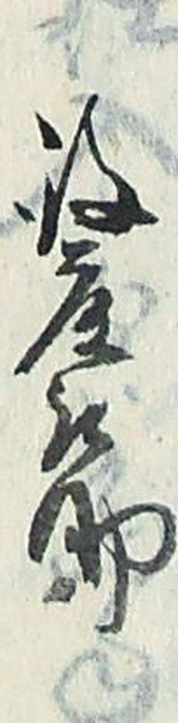後藤善助
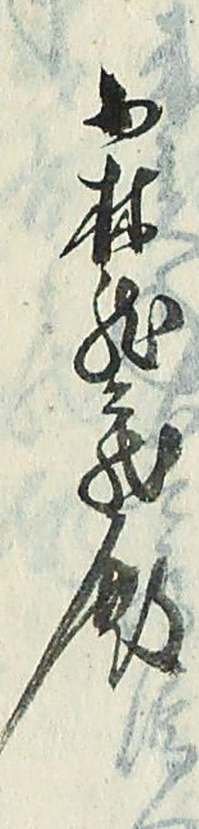小林龍三殿
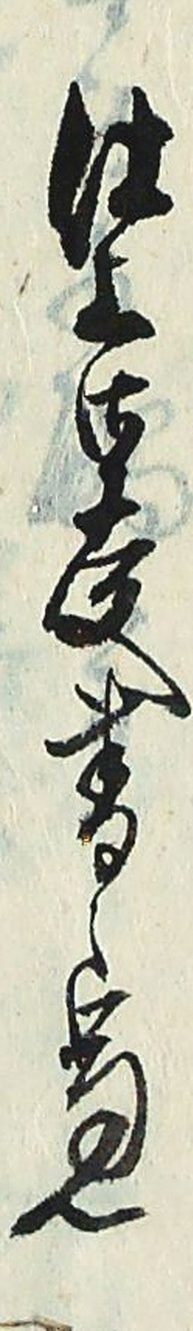仕上御受書之覚
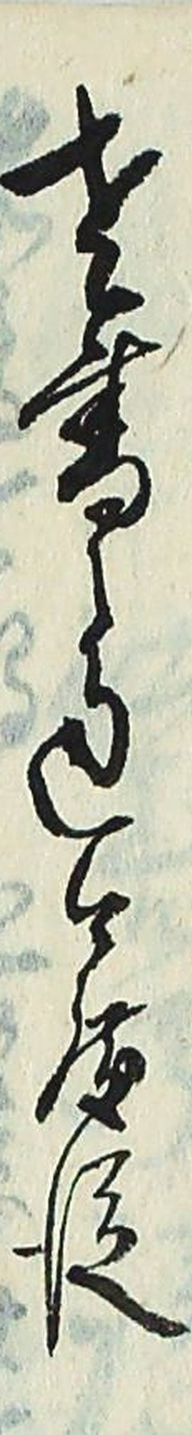左書之通今度従
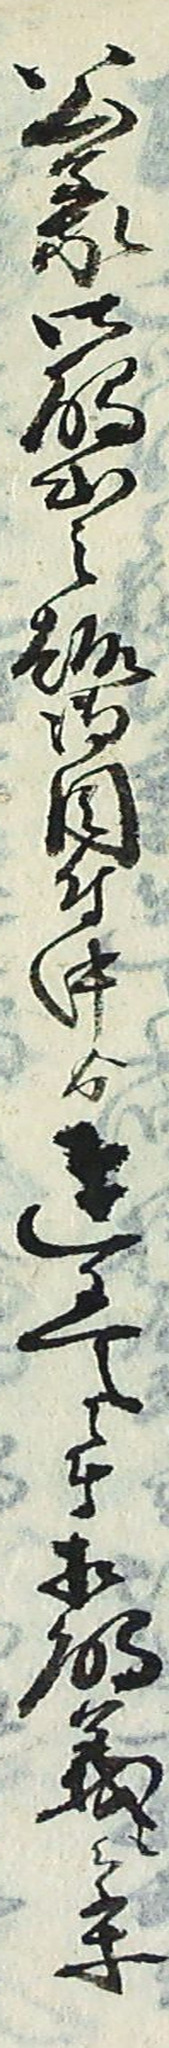公義御触出之趣御目付中ゟ達有之候に付相触義に候条
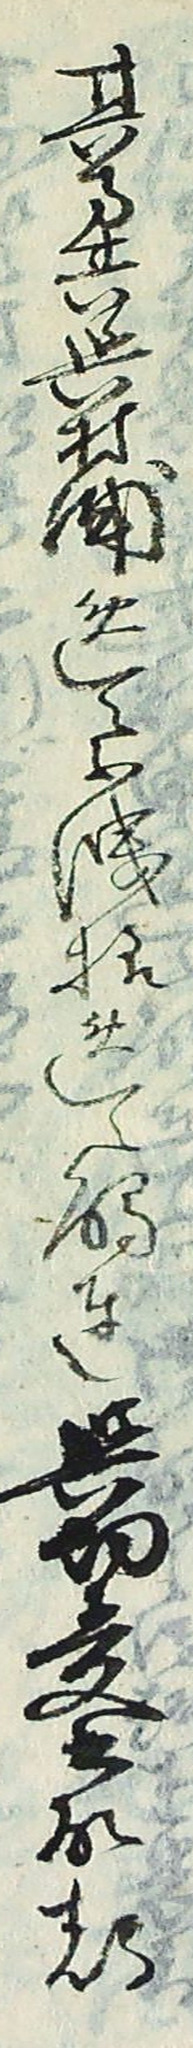其方共与村浦逸々不洩様逸々触達与切受書取都
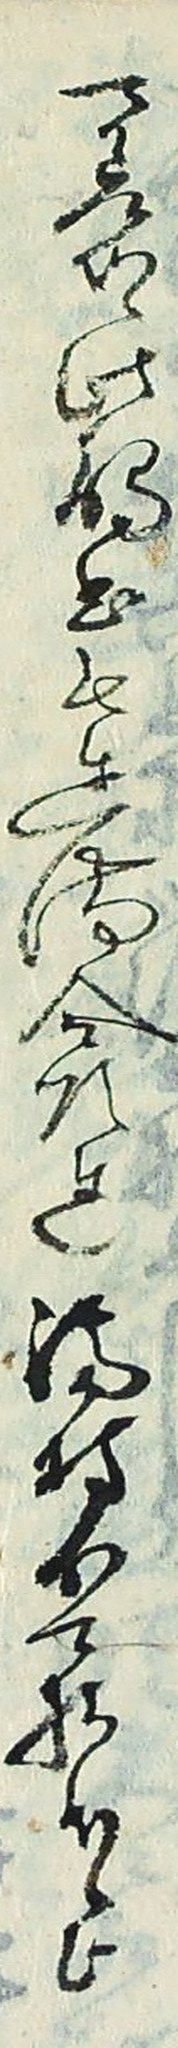可差出候此触書無遅滞令順達済村ゟ指戻候以上
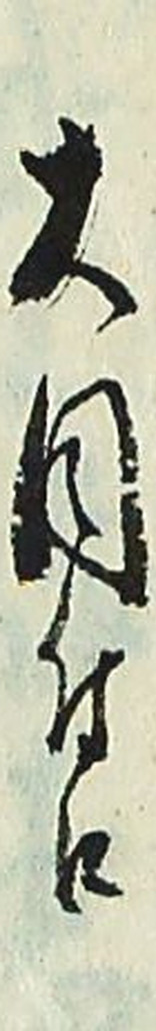大目付江
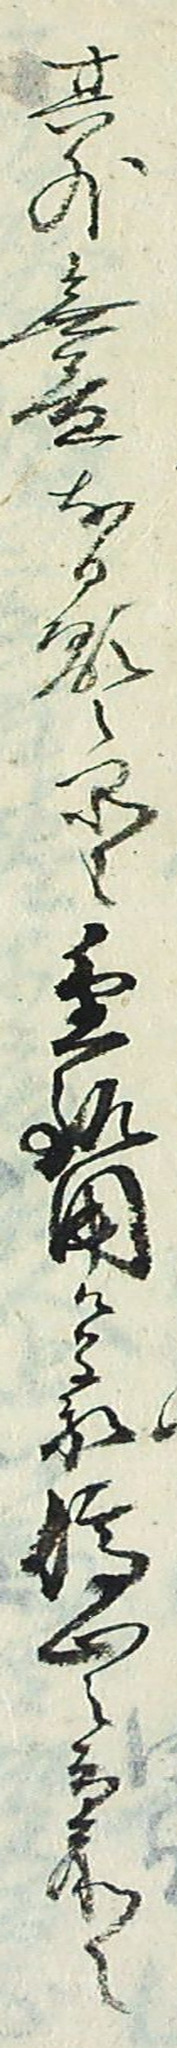其外無益なる類之品に金銀用候義停止之旨前々
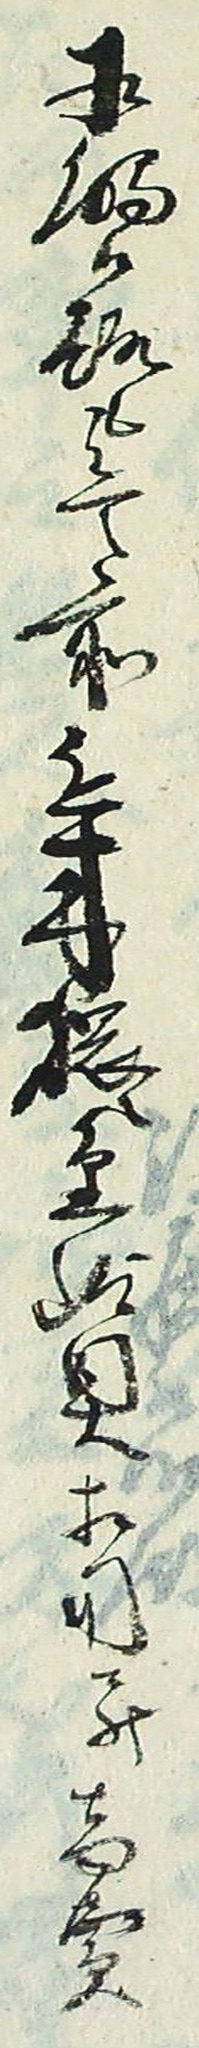相触候趣も有之候所近来猥に金銀具相用幷商売
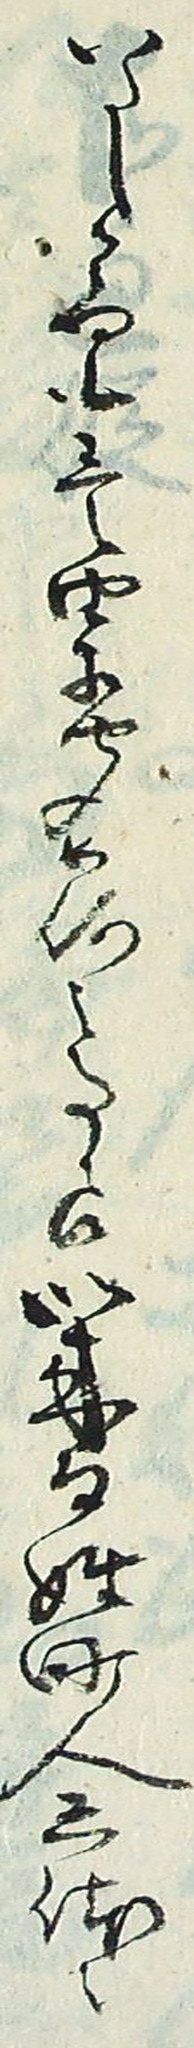いたし候者も有之由相聞如何之事に候以来百姓町人右体之
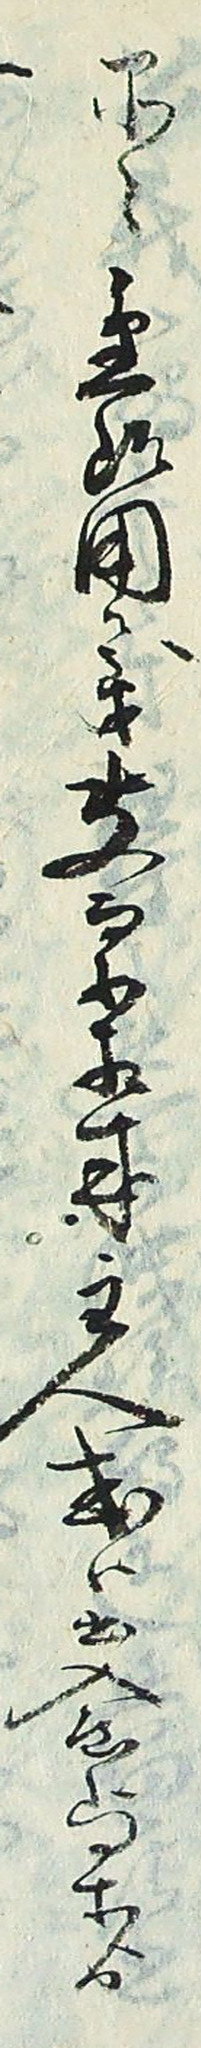品に金銀用候義決而不相成主人或は出入屋布等ゟ
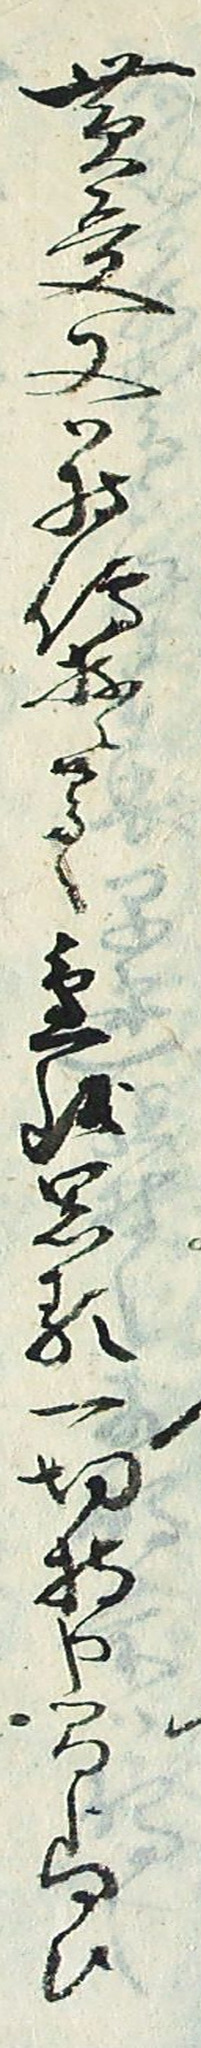貰受又は持伝抔に候とも金銀器類一切持申間布候
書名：諸御用御□受書控
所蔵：鳴門教育大学 Naruto University of Education
